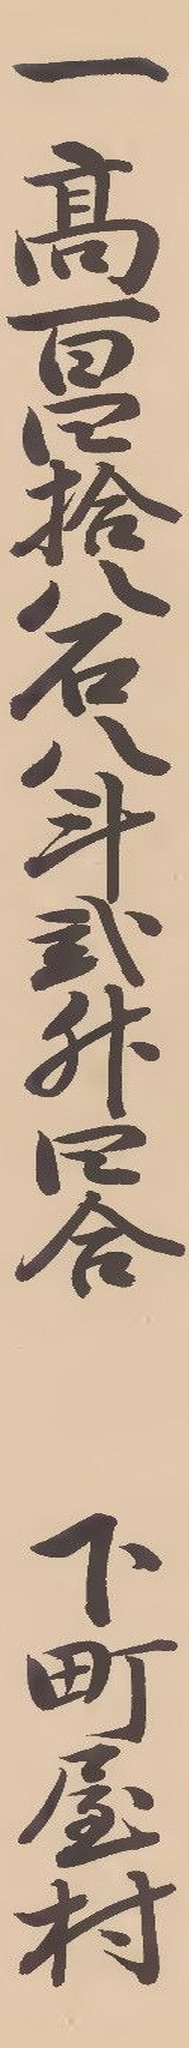一高百四拾八石八斗弐升四合下町屋村
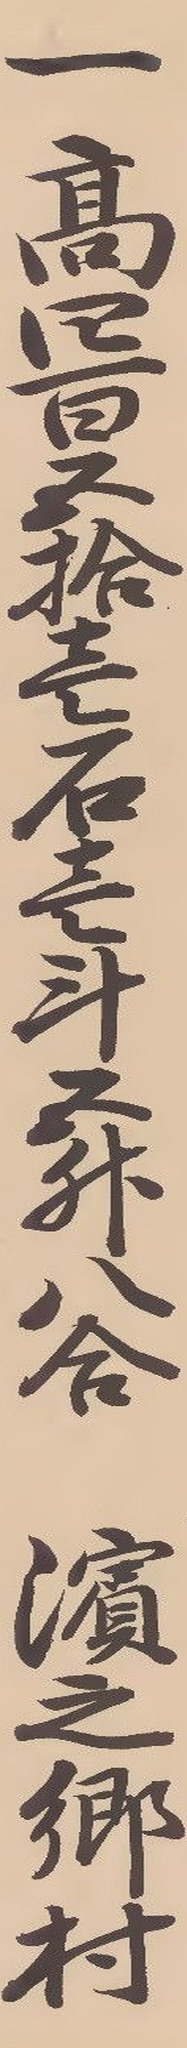一高四百五拾壱石壱斗五升八合濱之郷村
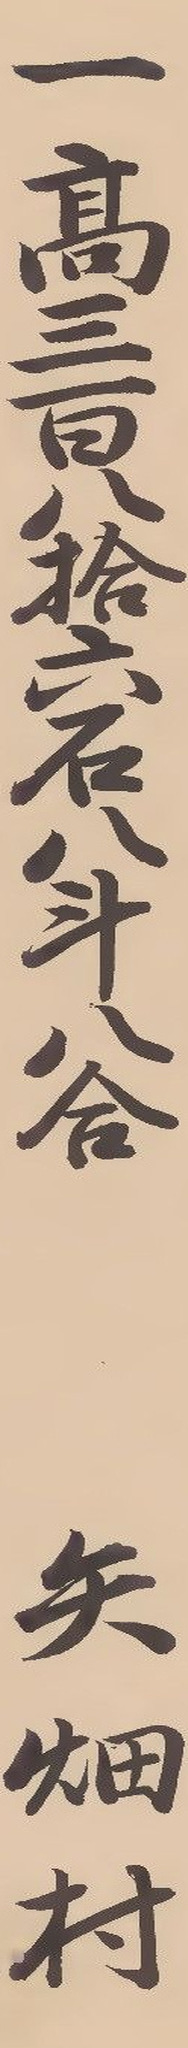一高三百八拾六石八斗八合矢畑村
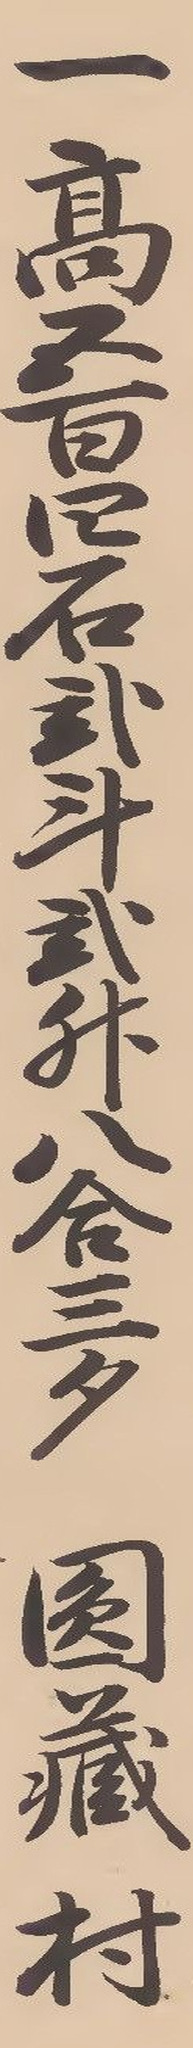一高五百四石弐斗弐升八合三勺円蔵村
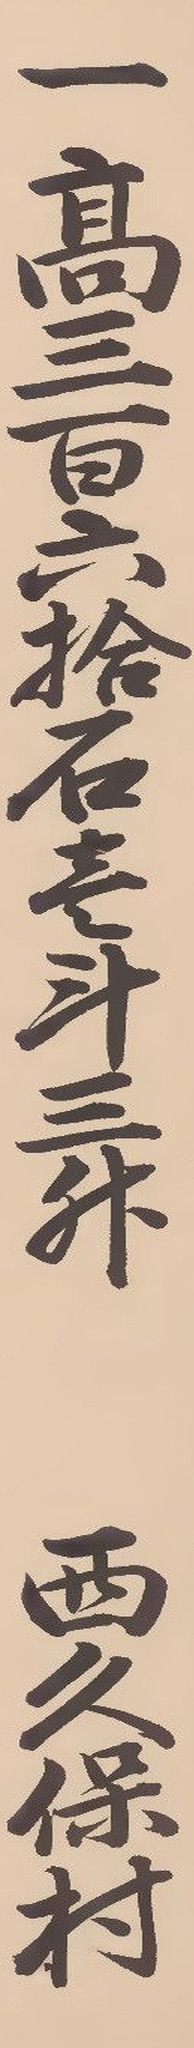一高三百六拾石壱斗三升西久保村
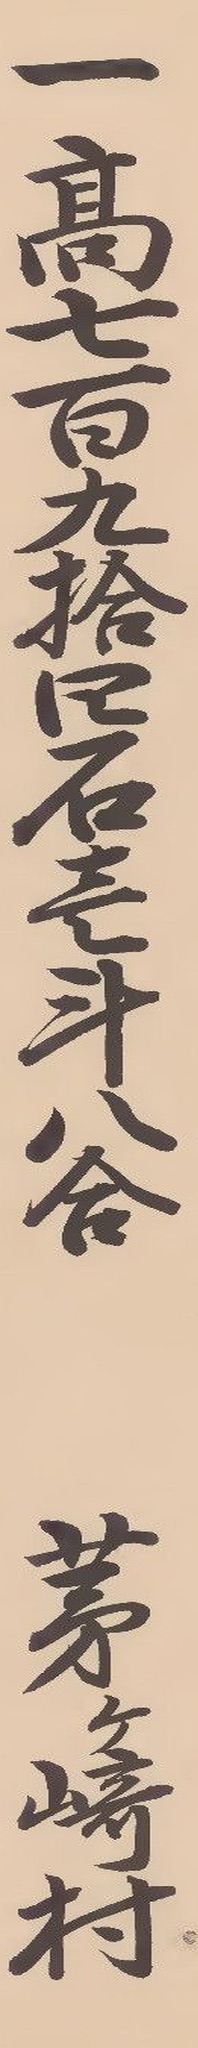一高七百九拾四石壱斗八合茅ヶ崎村
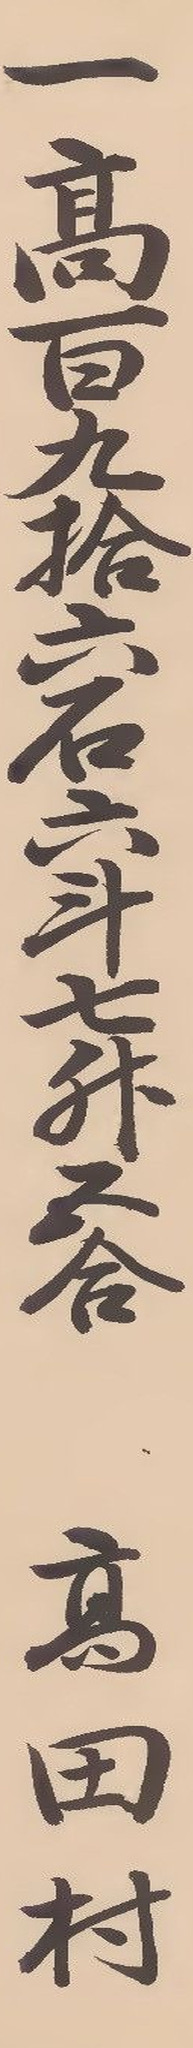一高百九拾六石六斗七升五合高田村
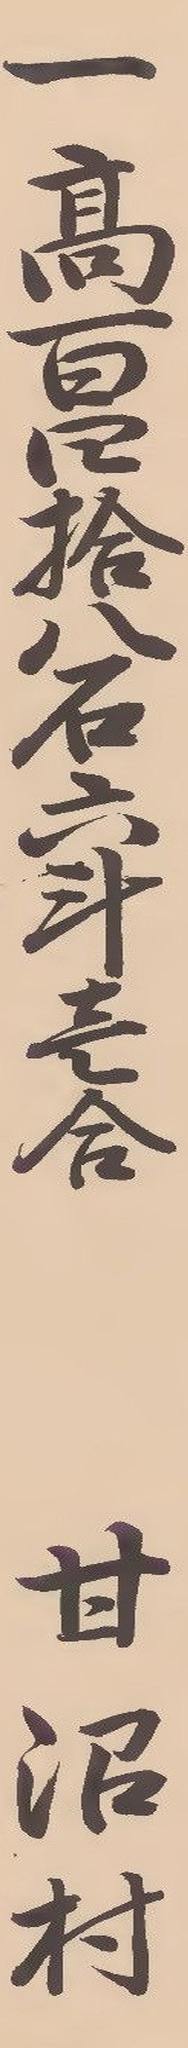一高百四拾八石六斗壱合甘沼村

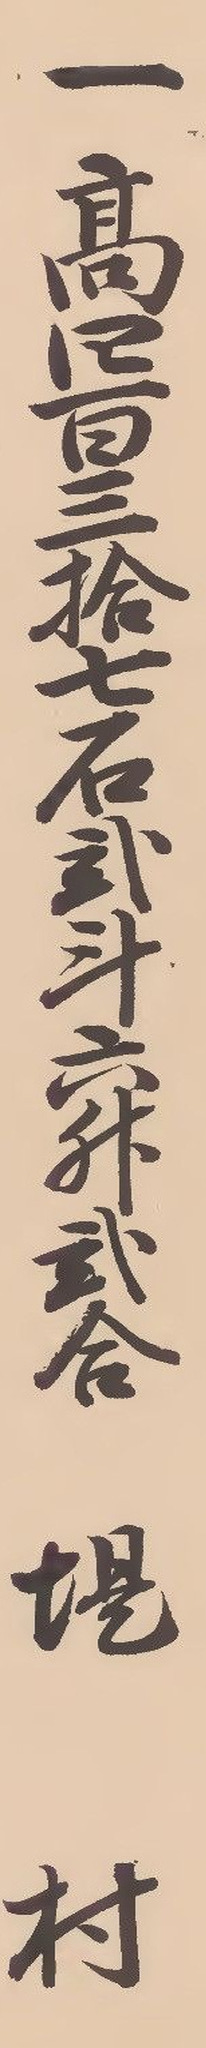一高四百三拾七石弐斗六升弐合堤村
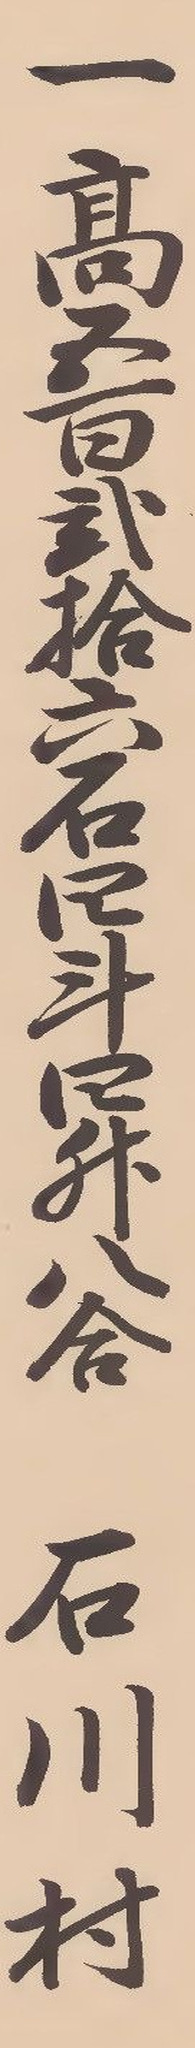一高五百弐拾六石四斗四升八合石川村
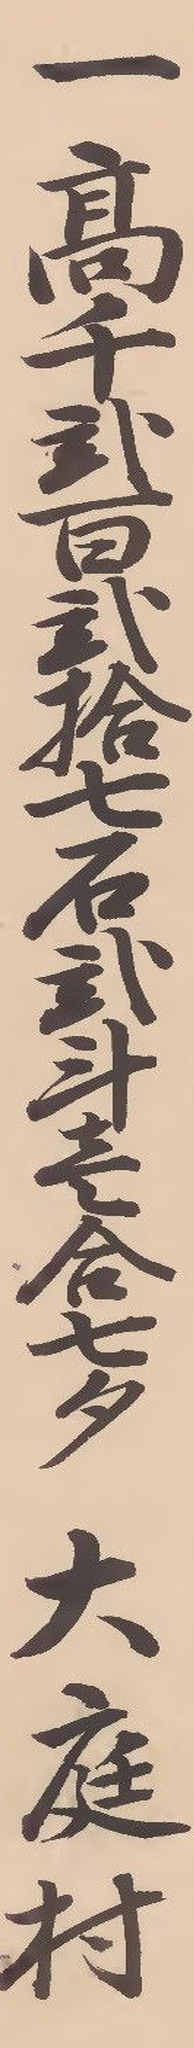一高千弐百弐拾七石弐斗壱合七勺大庭村
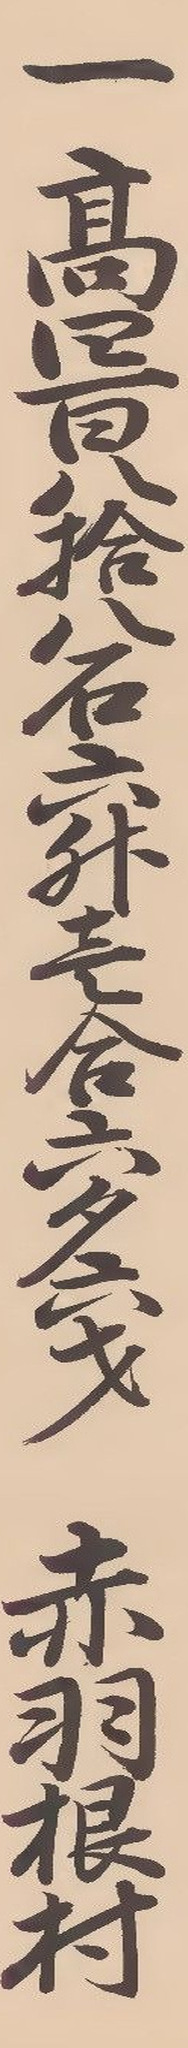一高四百八拾八石六升壱合六勺六才赤羽根村
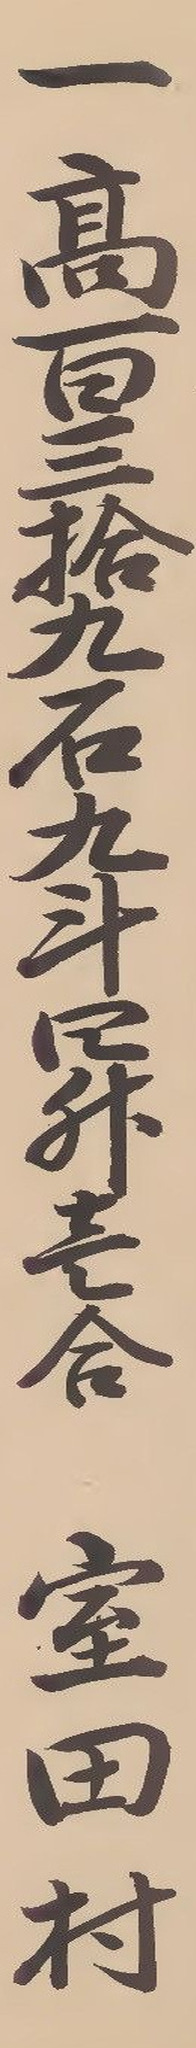一高百三拾九石九斗四升壱合室田村
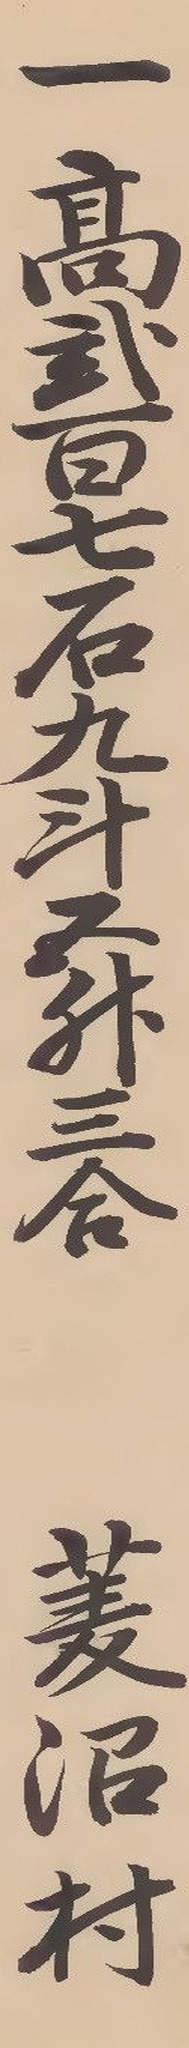一高弐百七石九斗五升三合菱沼村
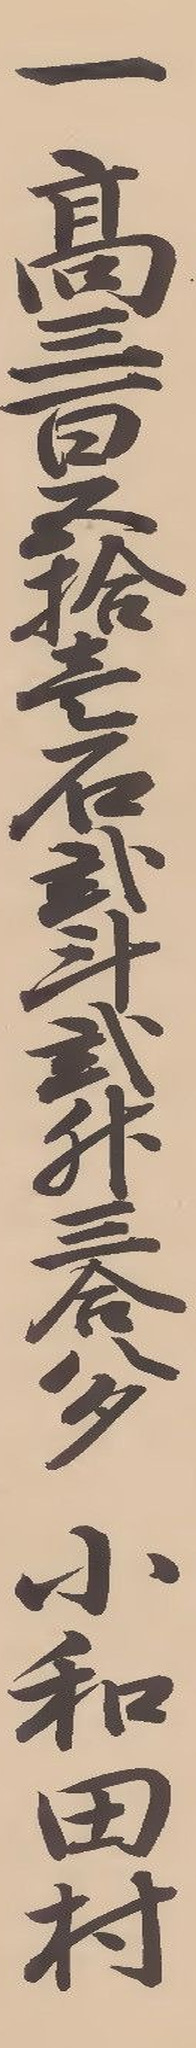一高三百五拾壱石弐斗弐升三合八勺小和田村
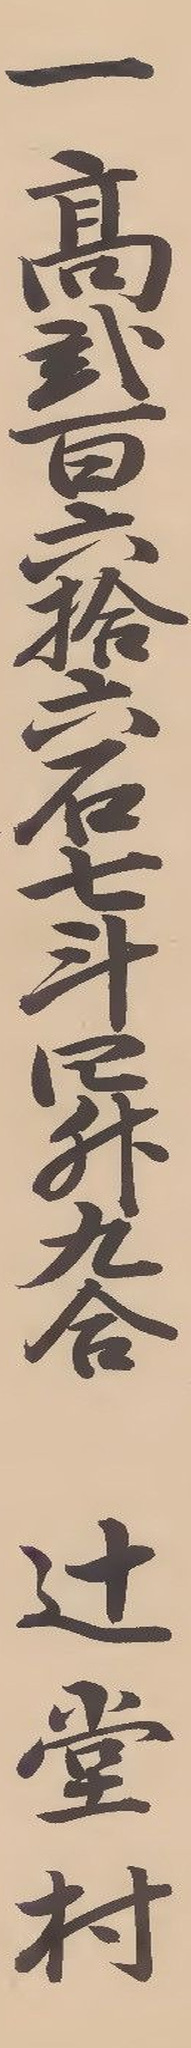一高弐百六拾六石七斗四升九合辻堂村
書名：相模国郷帳
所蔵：国立公文書館 National Archives of Japan
